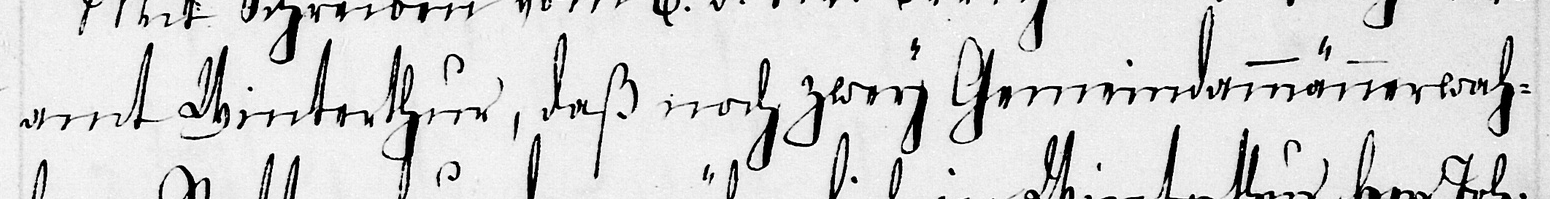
amt Winterthur, daß noch zwey Gemeindammännerwah¬
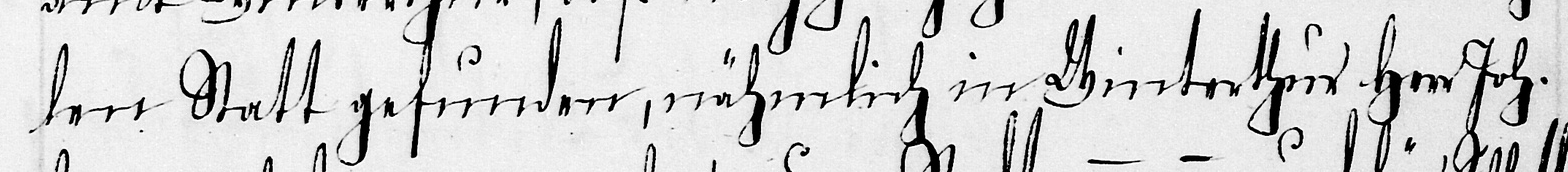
len Statt gefunden, nähmlich in Winterthur Herr Joh.
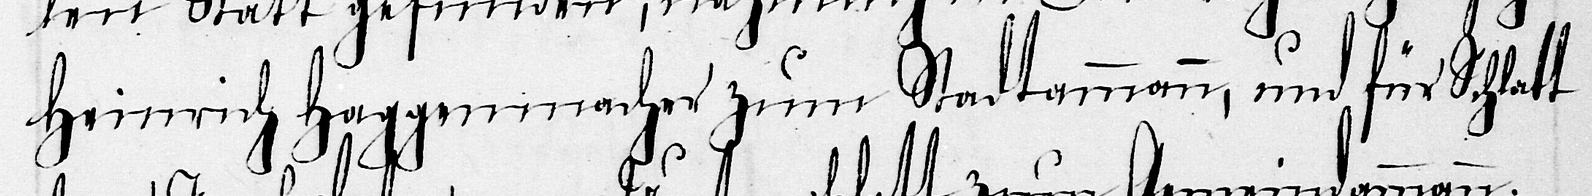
Heinrich Haggenmacher zum Stadtammann, und für Schlatt
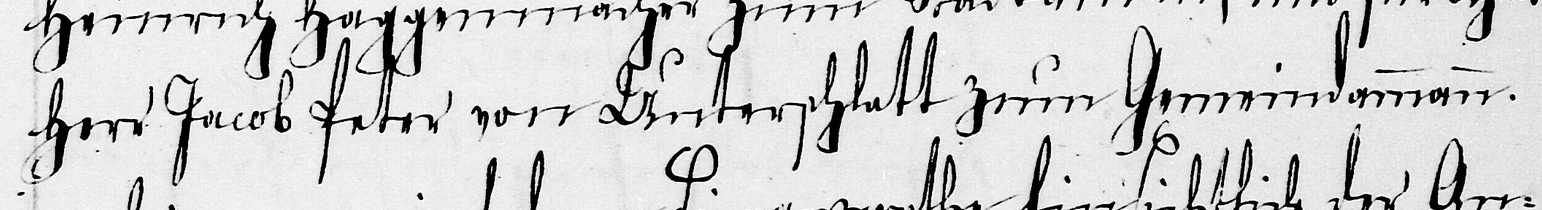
Herr Jacob Peter von Unterschlatt zum Gemeindammann.
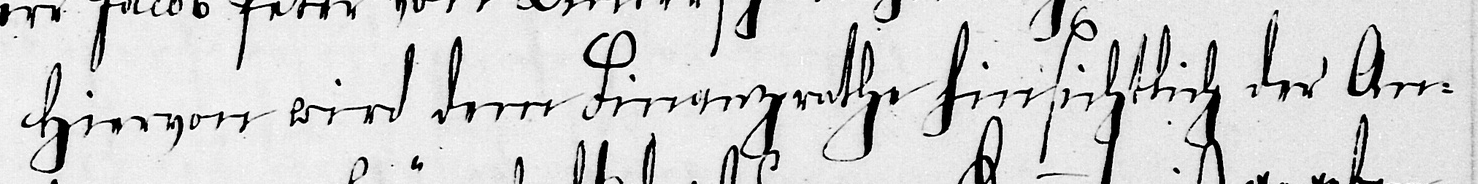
Hiervon wird dem Finanzrathe hinsichtlich der An¬
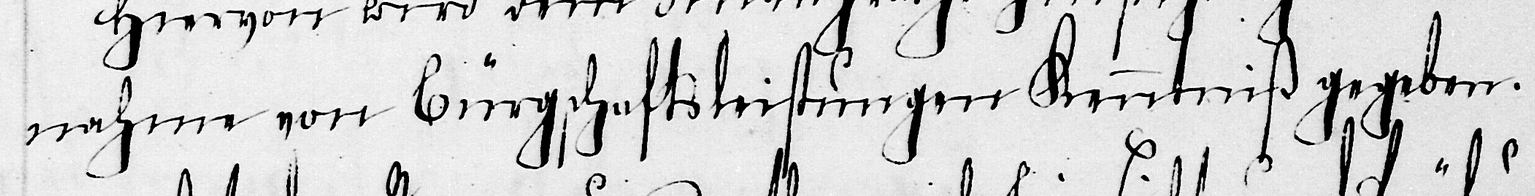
nahme von Bürgschaftsleistungen Kenntniß gegeben.
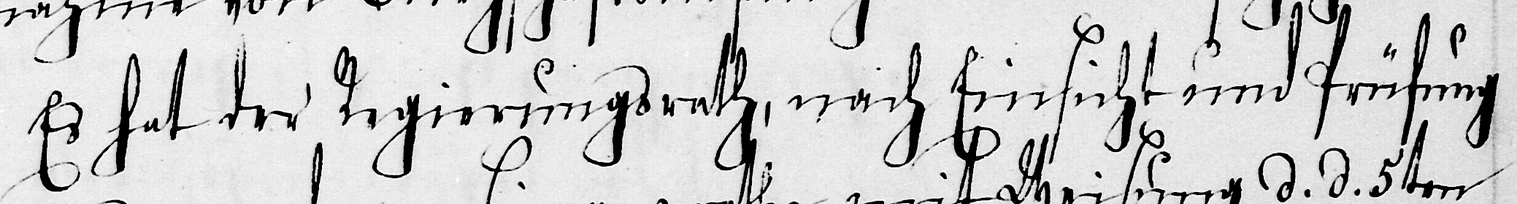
Es hat der Regierungsrath, nach Einsicht und Prüfung
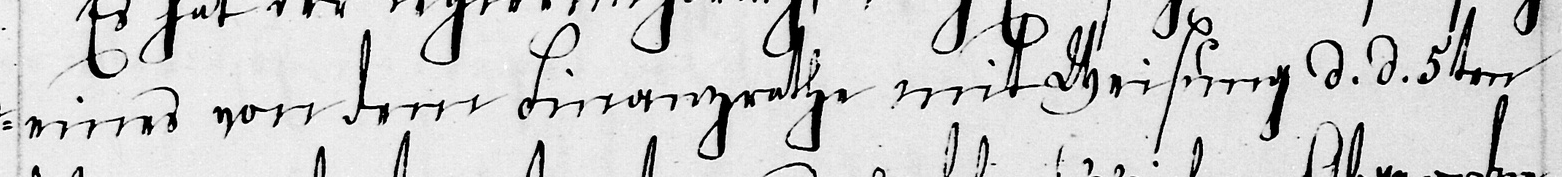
eines von dem Finanzrathe mit Weisung d. d. 5ten
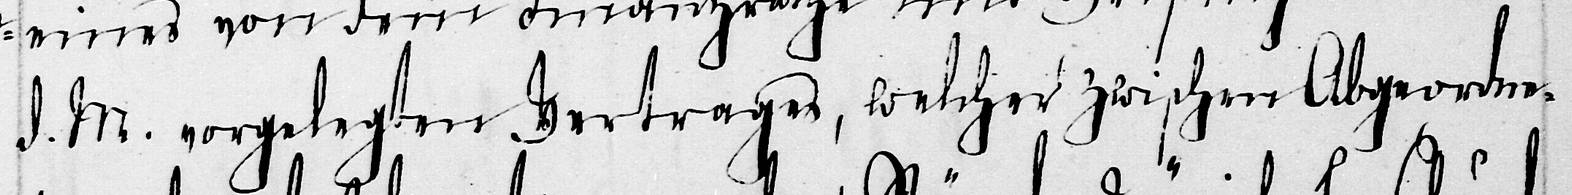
d. M. vorgelegten Vertrages welcher zwischen Abgeordne¬
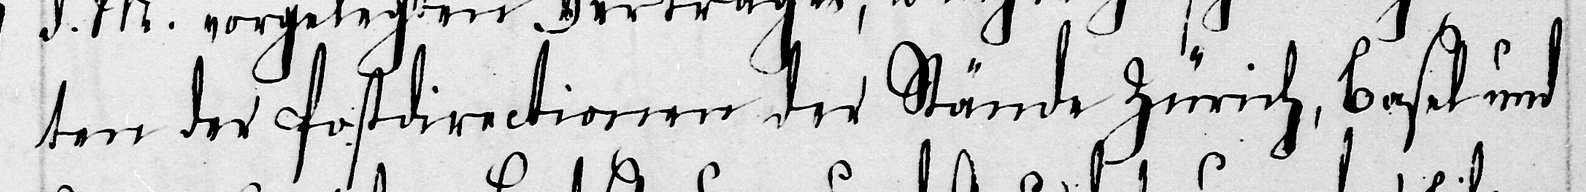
ten der Postdirectionen der Stände Zürich, Basel und
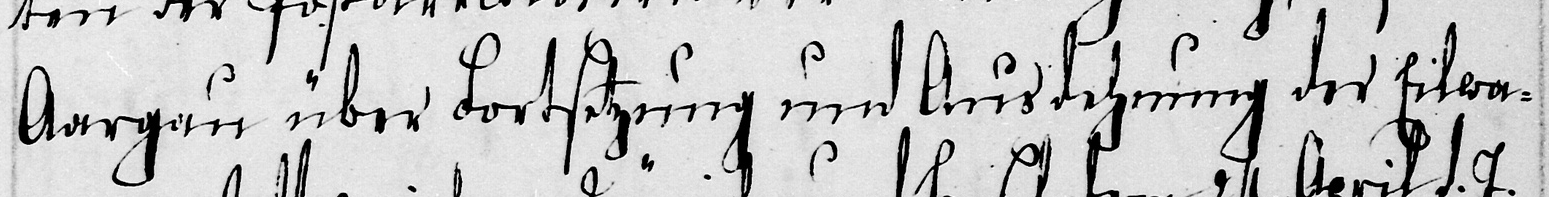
Aargau über Fortsetzung und Ausdehnung der Eilwa¬
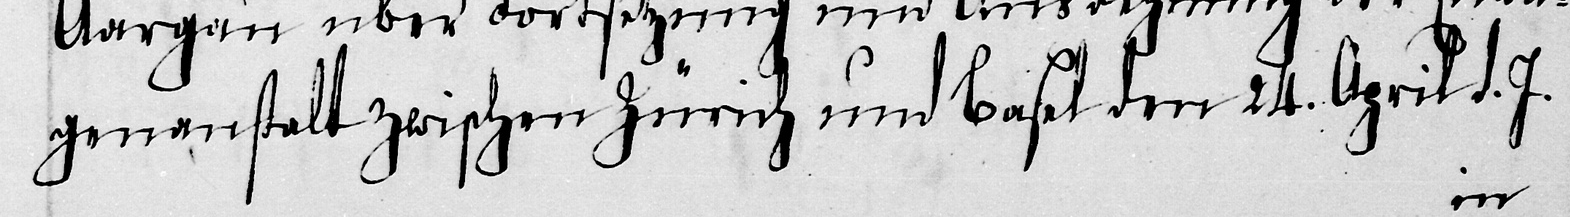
genanstalt zwischen Zürich und Basel den 24. April d. J.
